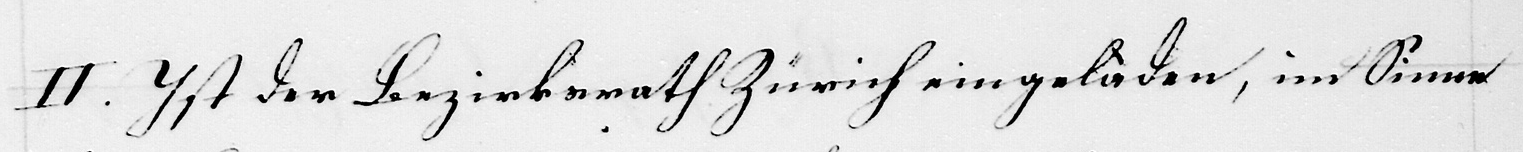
II. Ist der Bezirksrath Zürich eingeladen, im Sinne
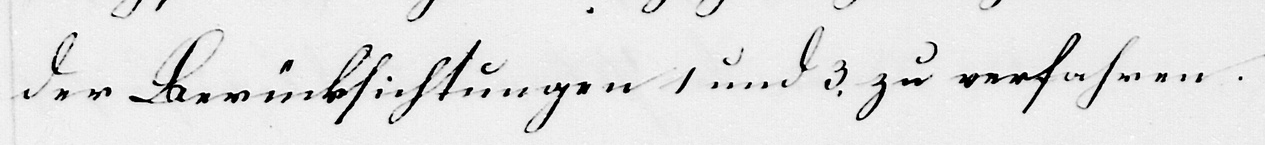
der Berücksichtungen [sic!] 1 und 3. zu verfahren.
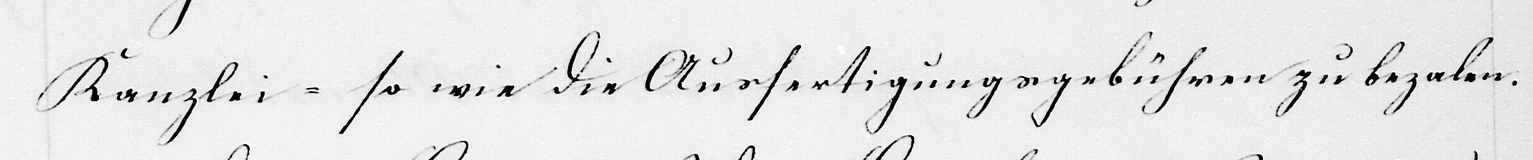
Kanzlei- so wie die Ausfertigungsgebühren zu bezalen.
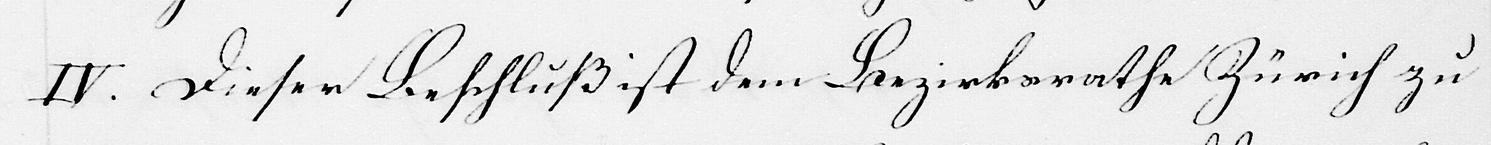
IV. Dieser Beschluß ist dem Bezirksrathe Zürich zu
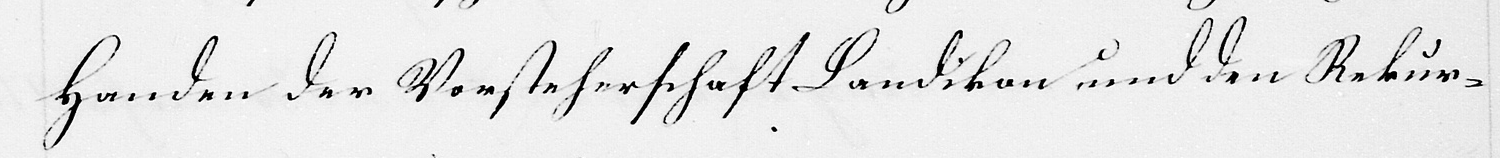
Handen der Vorsteherschaft Landikon und den Rekur¬
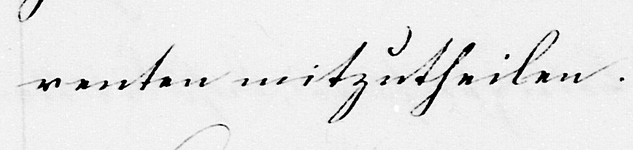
renten mitzutheilen.
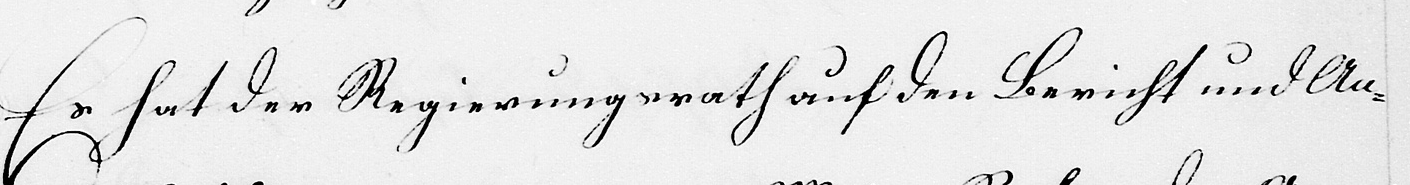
Es hat der Regierungsrath auf den Bericht und An¬
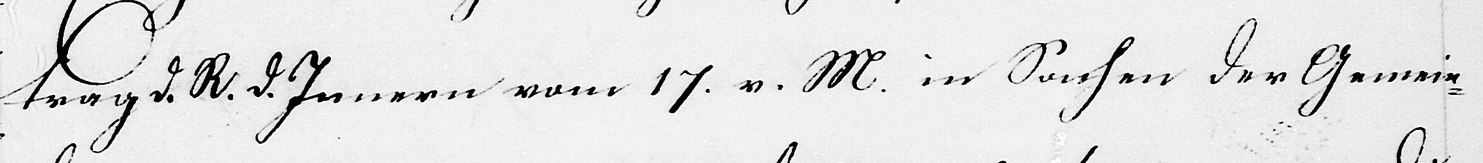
trag d. R. d. Innern vom 17. v. M. in Sachen der Gemein¬
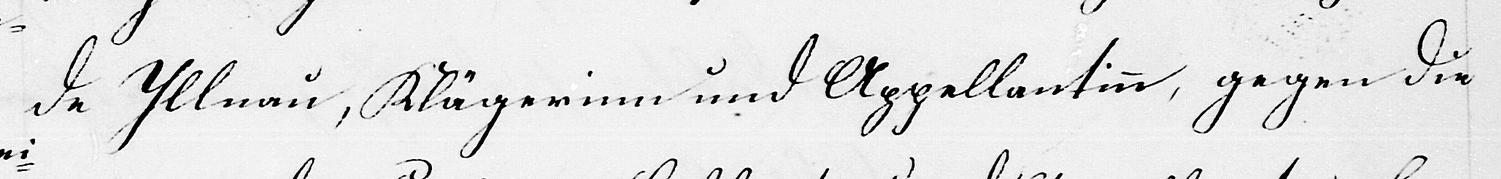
de Illnau, Klägerinn und Appellantinn, gegen die
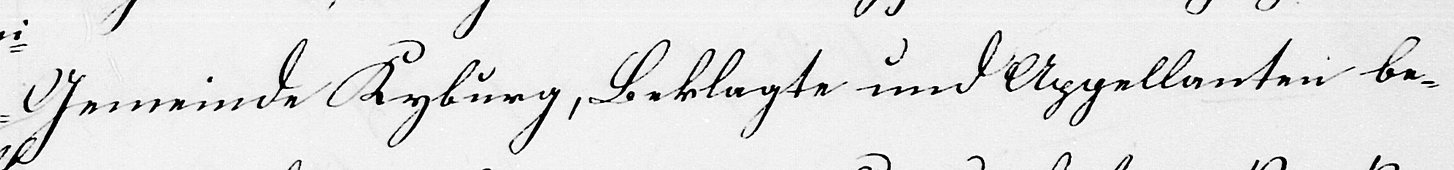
Gemeinde Kyburg, Beklagte und Appellanten be¬
